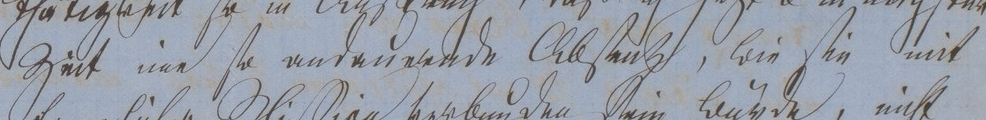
Zeit eine so andauernde Absenz, wie sie mit
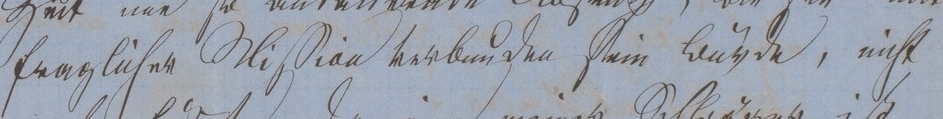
fraglicher Mission verbunden sein würde, nicht
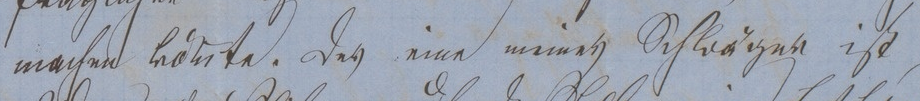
machen könnte. Der eine meiner Schwäger ist
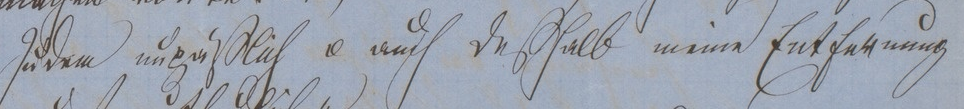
zudem unpässlich & auch deßhalb meine Entfernung
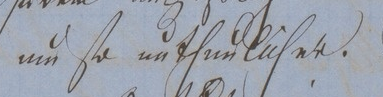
umso unthunlicher.
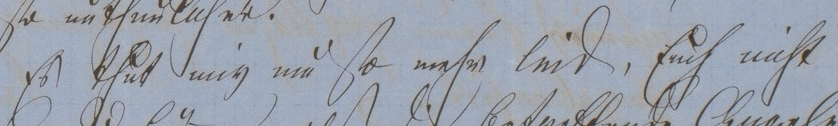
Es thut mir umso mehr leid, Euch nicht
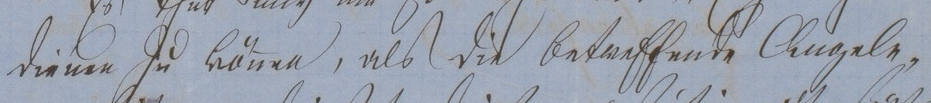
dienen zu können, als die betreffende Angele-
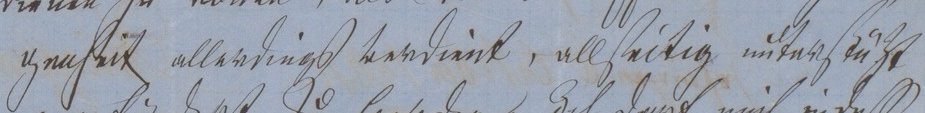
genheit allerdings verdient, allseitig unterstützt
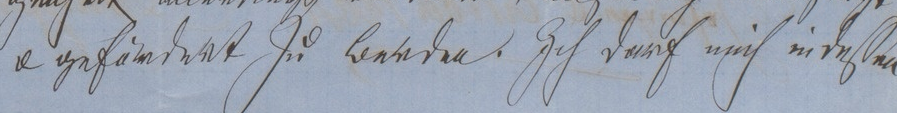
& gefördert zu werden. Ich darf mich indessen
